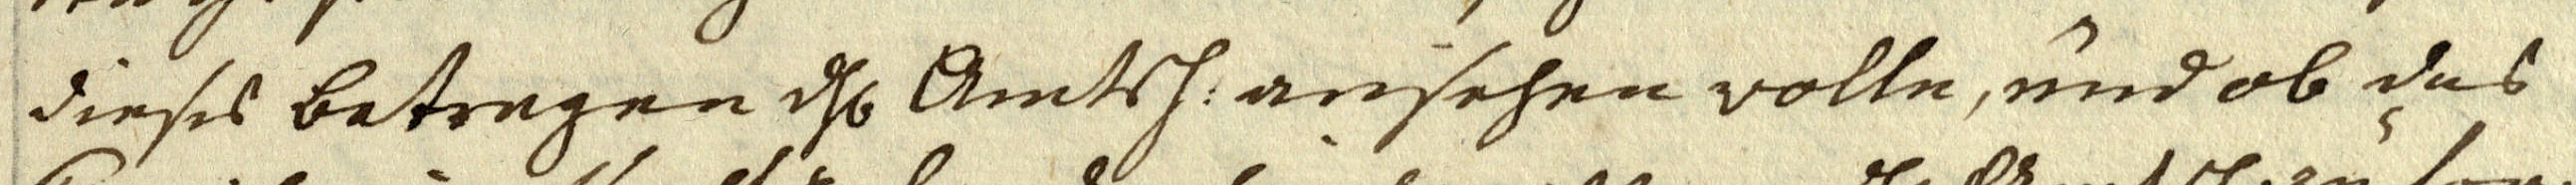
dieses Betragen dh. Amtsh. ansehen wolle, und ob das
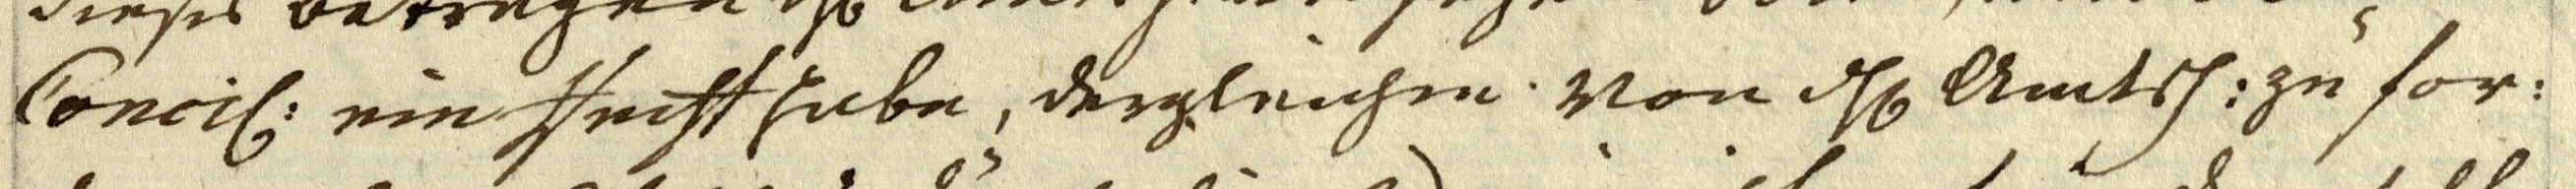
Concil. ein Recht habe, dergleichen von dh. Amtsh. zu for¬
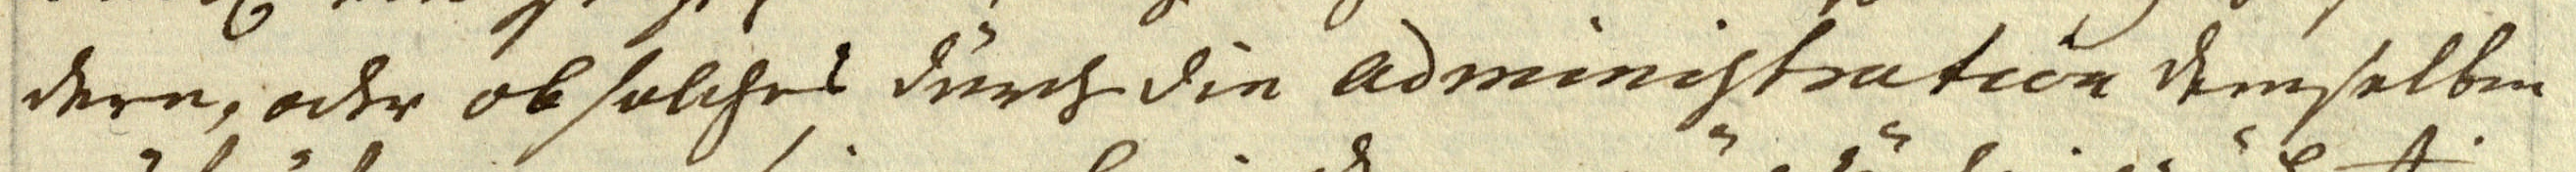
dern, oder ob solches durch die Administration demselben
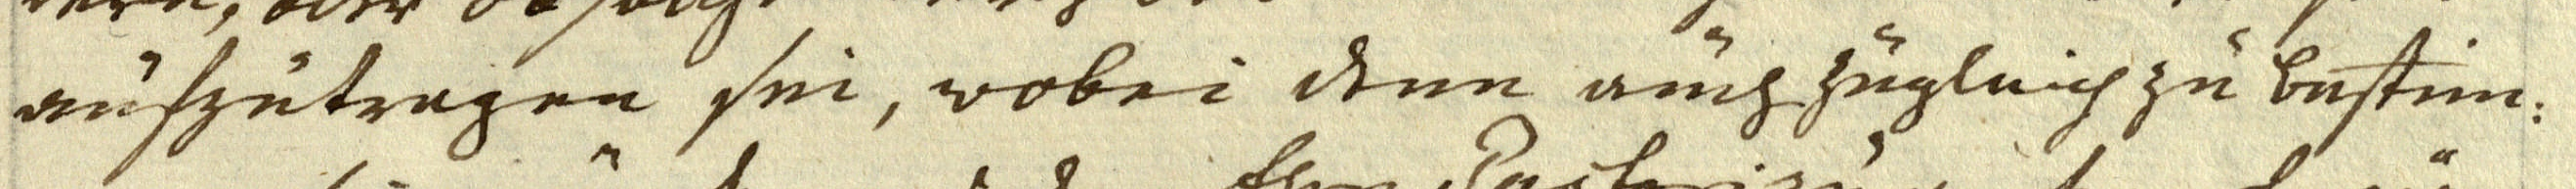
aufzutragen sei, wobei denn auch zugleich zu bestim¬
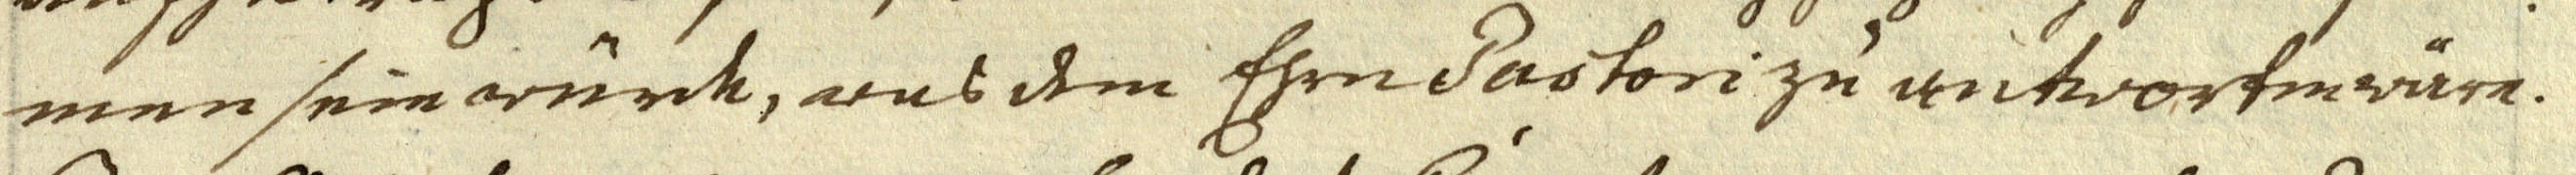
men sein würde, was dem Ehrn Pastori zu antworten wäre.
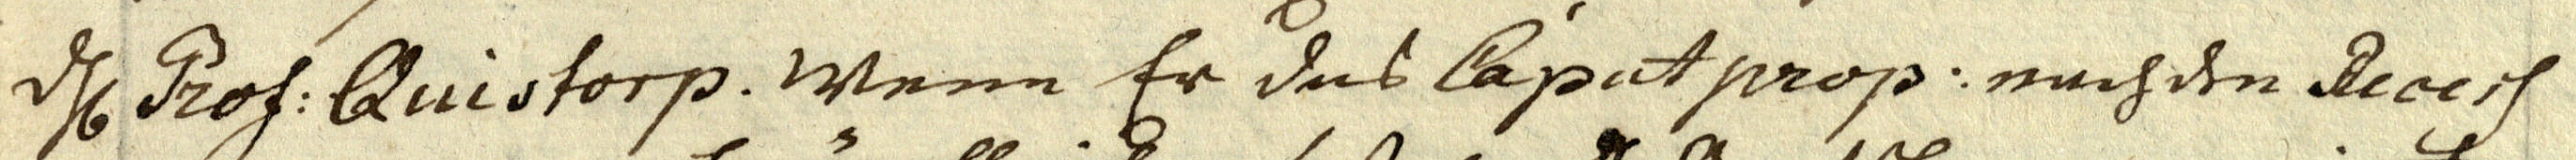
dh. Prof. Quistorp. Wenn Er das Caput prop. nach den Recess
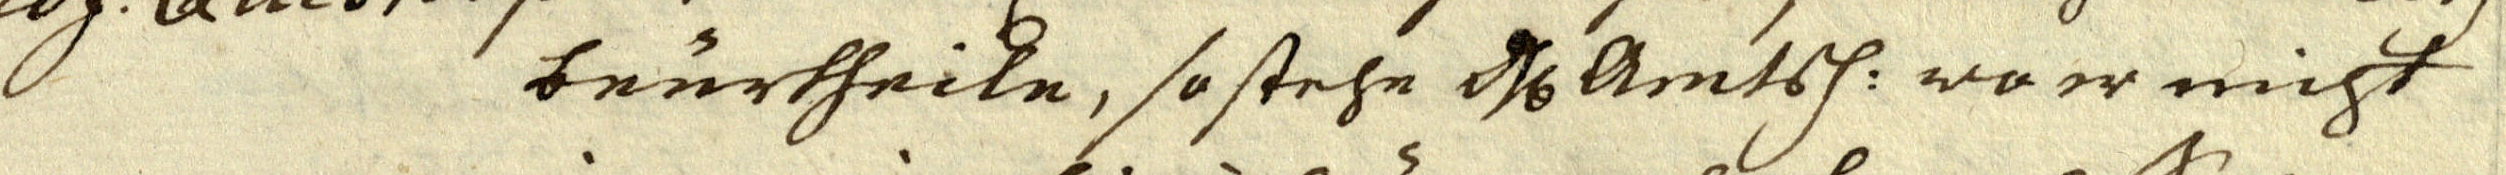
beurtheile, so stehe dh. Amtsh. wo er nicht
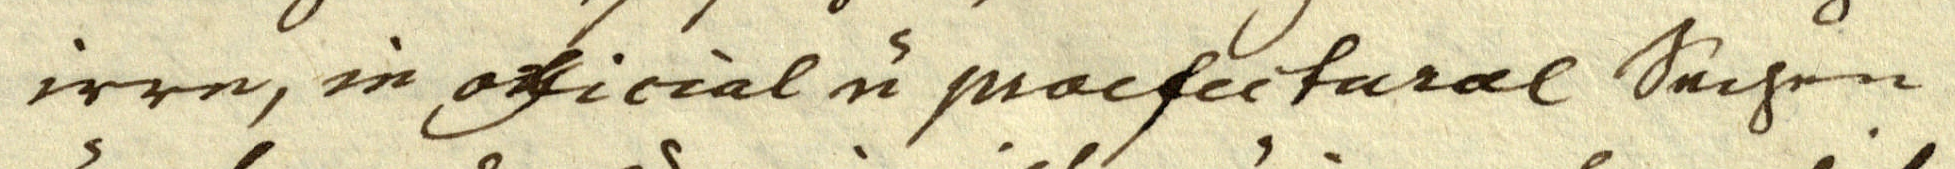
irre, in official u praefectural Sachen
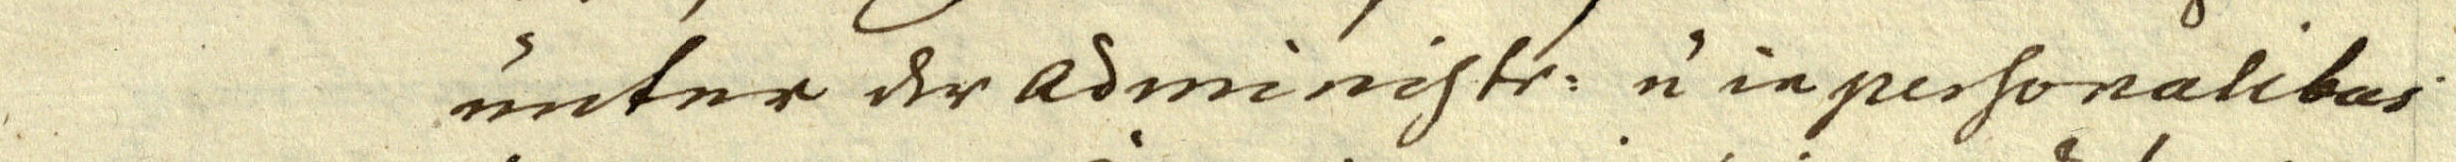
unter der Administr. u in personalibus
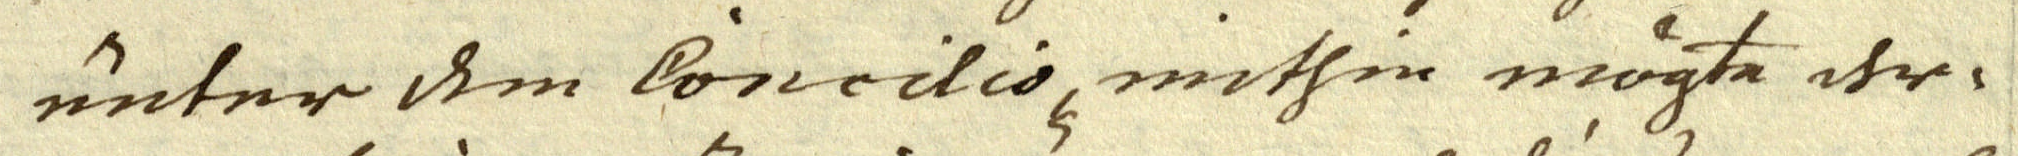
unter dem Concilio mithin mögte der¬
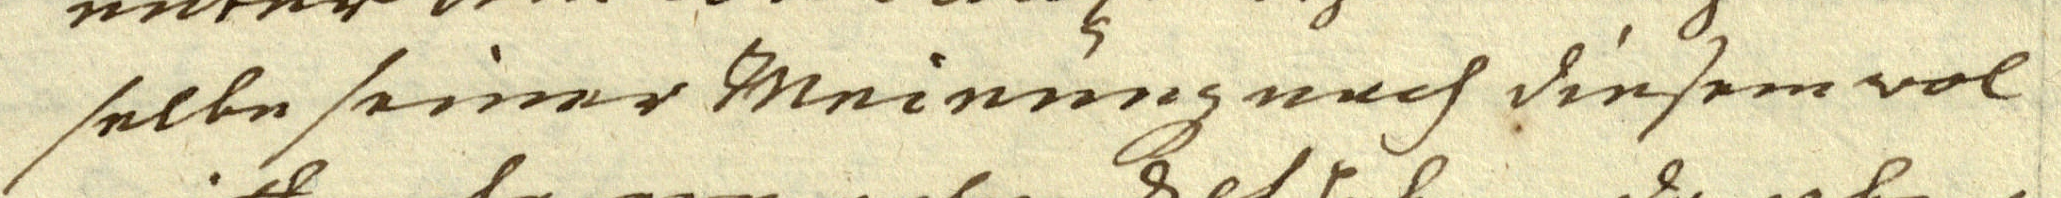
selbe seiner Meinung nach diesem wol
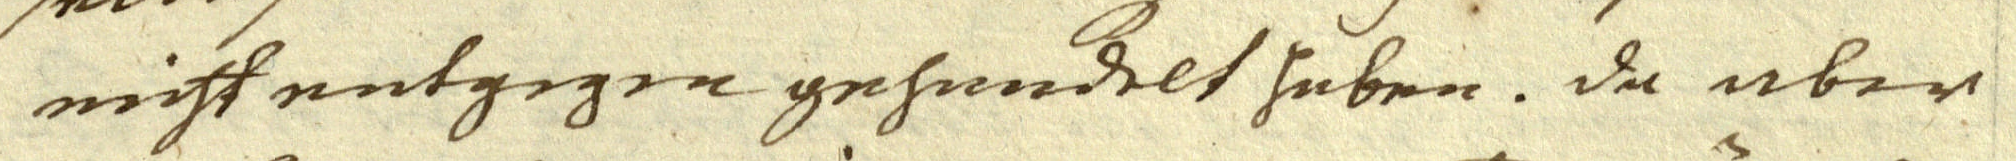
nicht entgegen gehandelt haben. Da aber
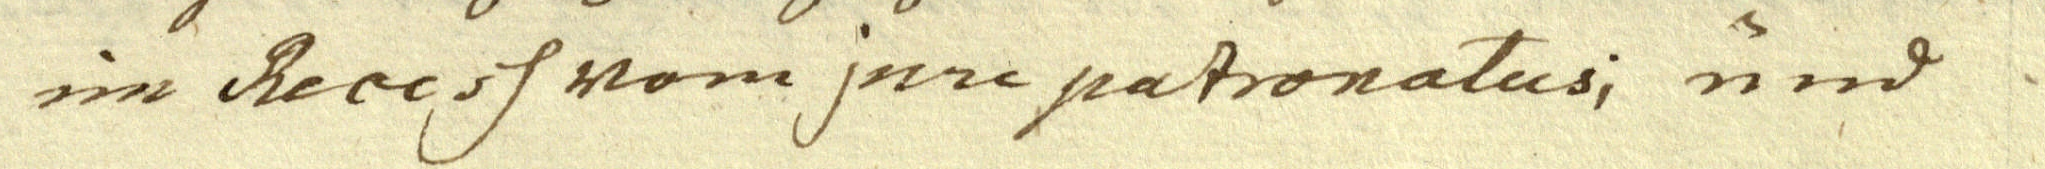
im Recess vom jure patronatus; und
